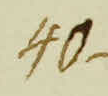40
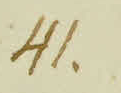41.
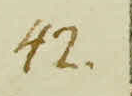42.
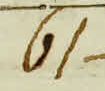61
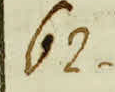62
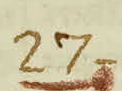27
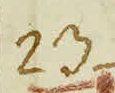23
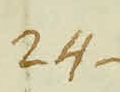24
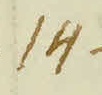14
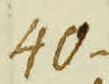40
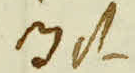38
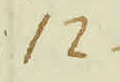12
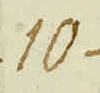10
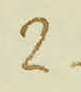2
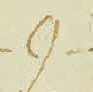9
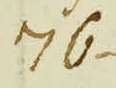76
